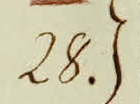28.
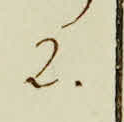2.
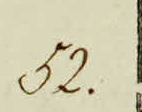52.
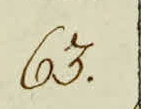63.
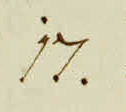17.
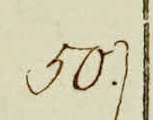50.
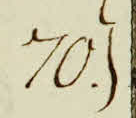70.
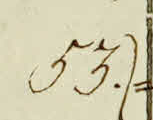53.
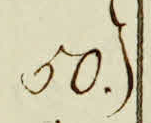50.
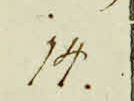14.
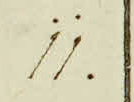11.
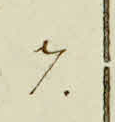7.
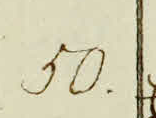50.
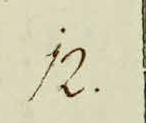12.
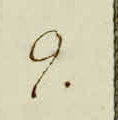9.
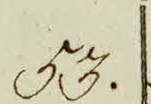53.
